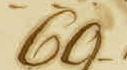69
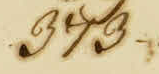373
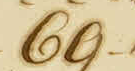69
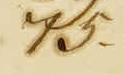75
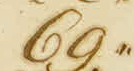69
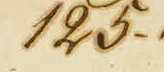125
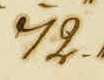72
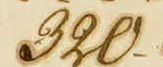320
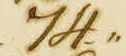74
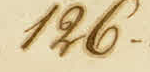126
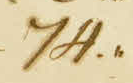74.
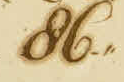86.
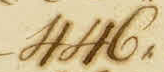446
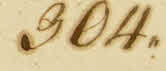304
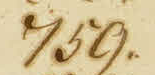759.
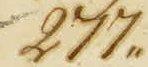277
